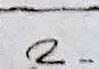2
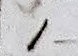1
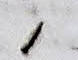1
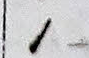1
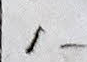1
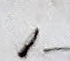1
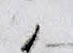1
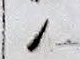1
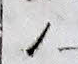1
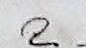2
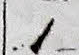1
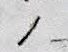1
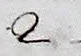2
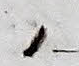1
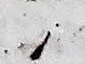1
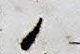1
